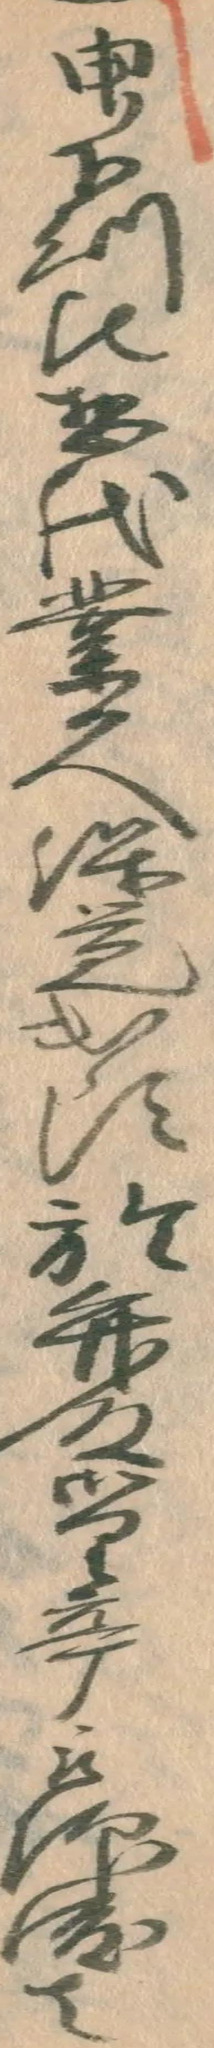一申ノ下刻比惣代業久保覚出頭於弁殿御里亭被仰渡者
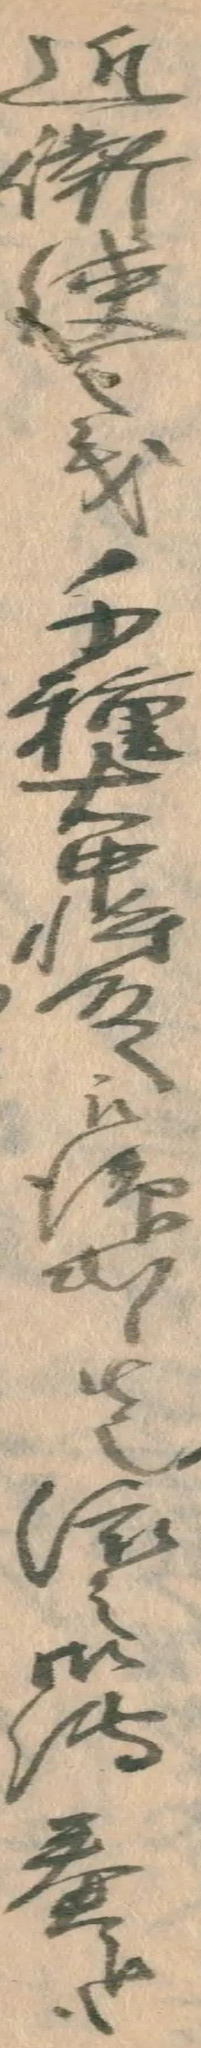近衛使之義千種右中将殿へ被仰出候由也依之御伝奏江も
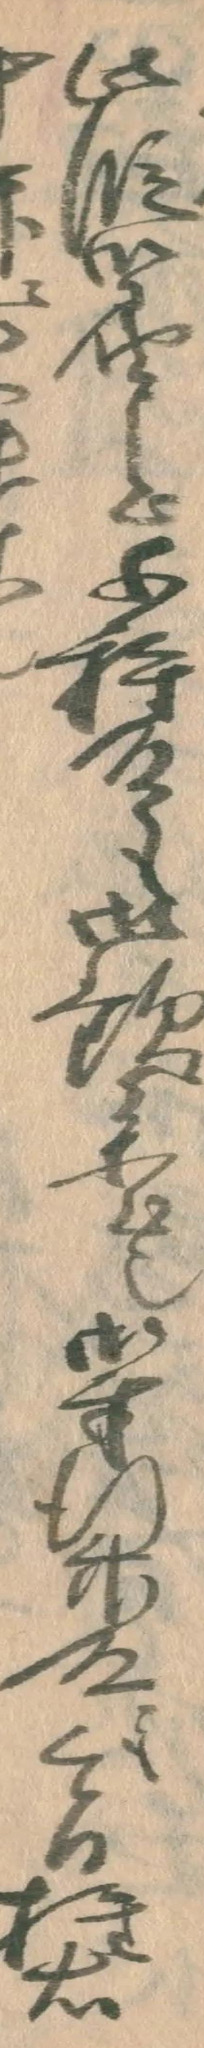此段御届申上千種殿へも御歓参上也御奉行弁殿ニも今日権右
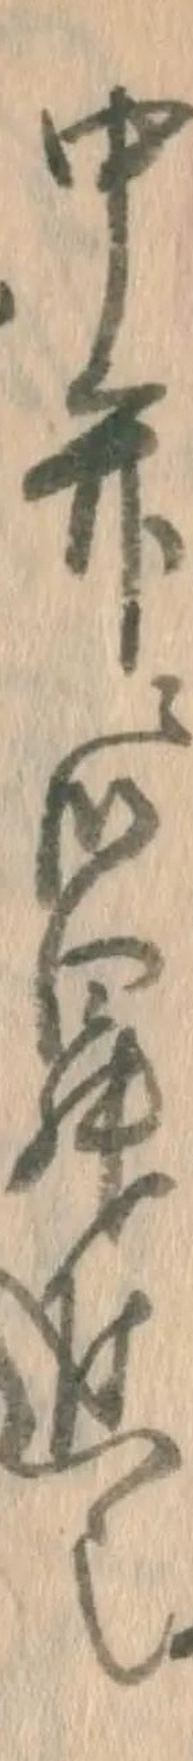中弁ニ御昇進也
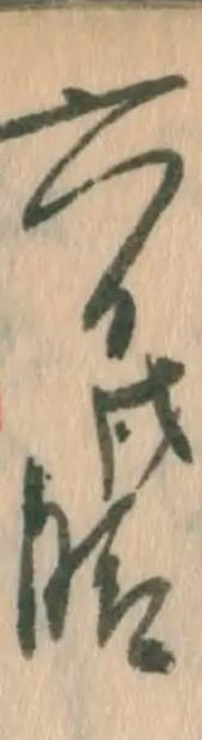六日戌晴
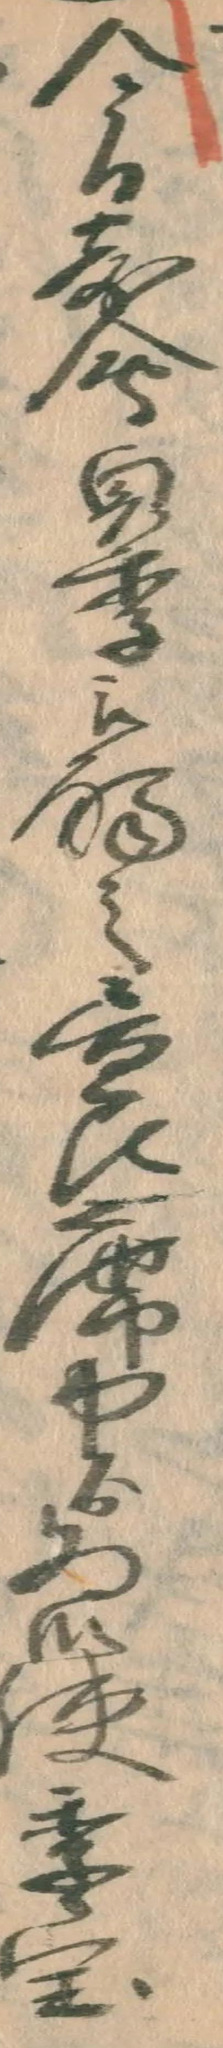一今日寄会貞季被触之昼比席中ゟ為御使季宝
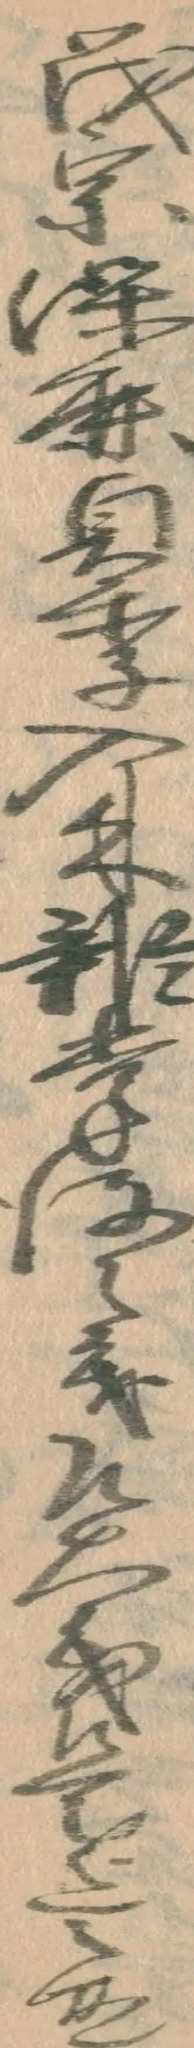茂宗保鹿貞季入来雑掌役之義左右義是迄之通
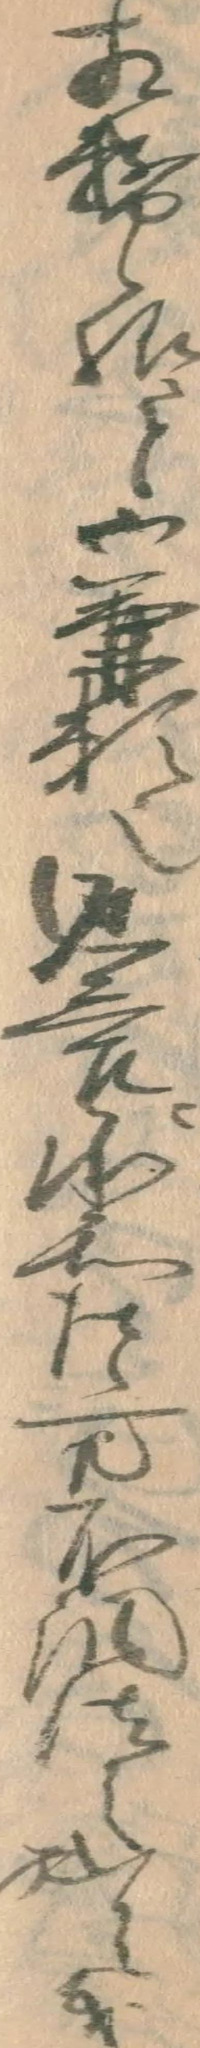相務候様ニて御兼頼也返答ニ承知仕候尤不調法之義
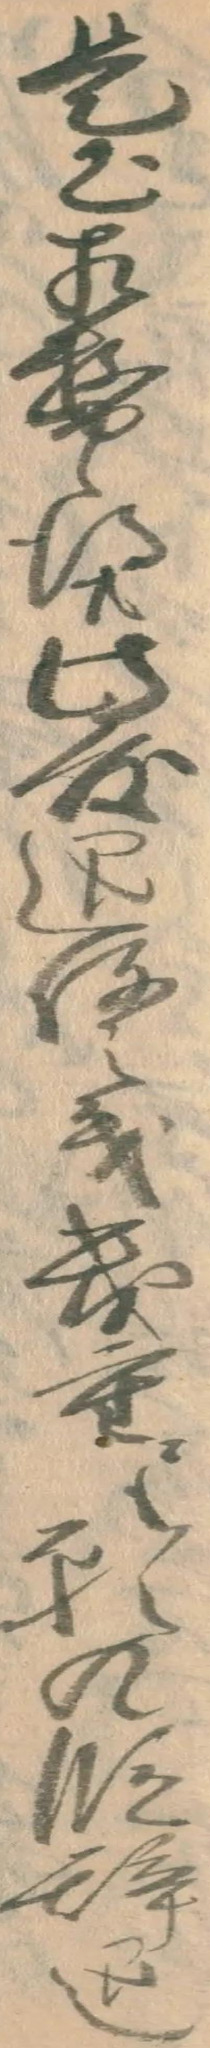是迄相務候得共此度退役之義幾重ニも願入候段辞退
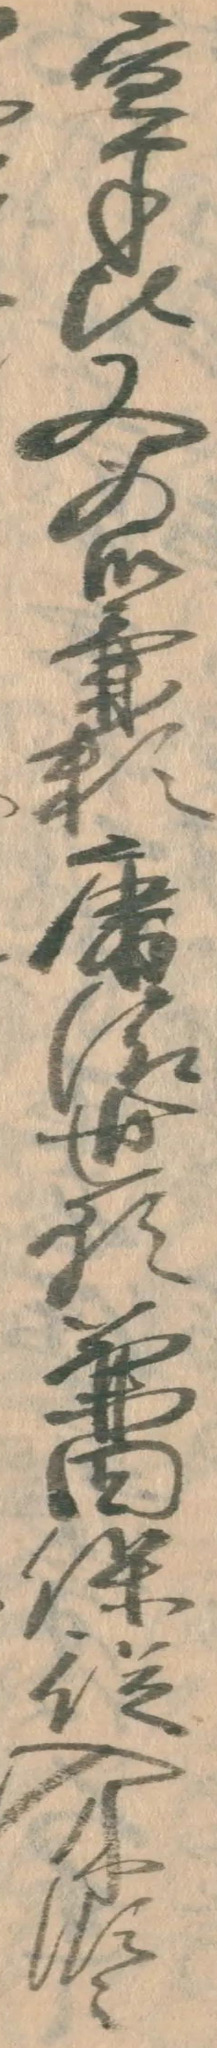昼半比又為御兼頼庸清世顕兼田保従入来段々
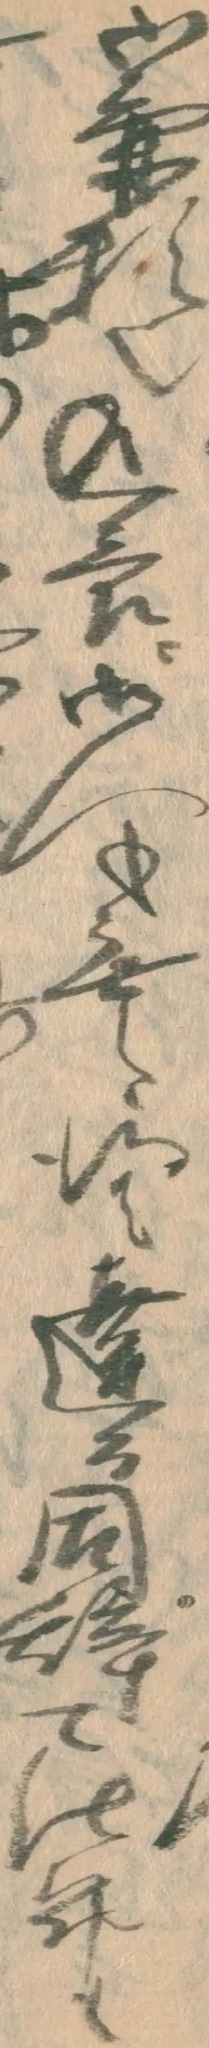御兼頼也返答ニ御人も無之候得者達而固辞可仕も
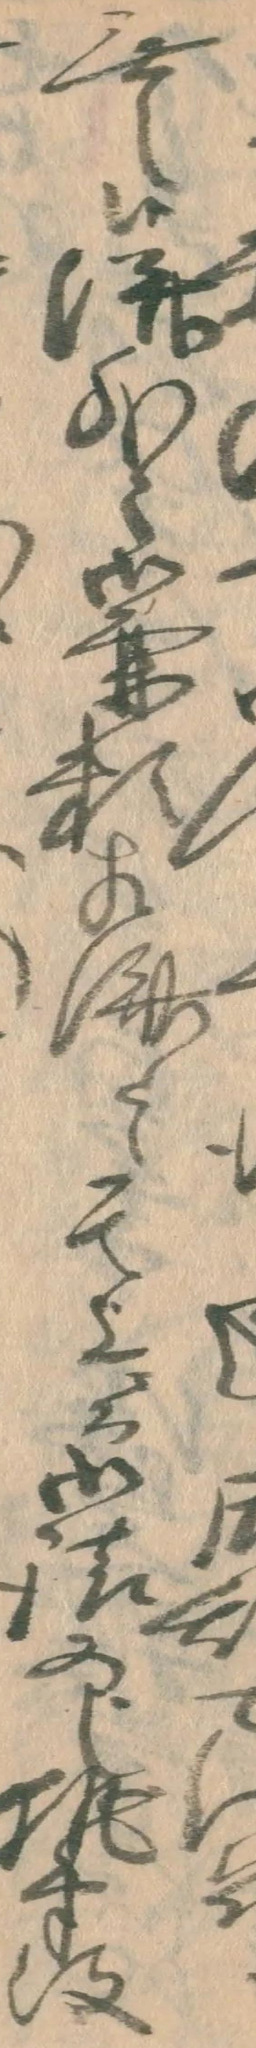無之候併外々御兼頼相済候て其上ニ而御請為申候執筆役
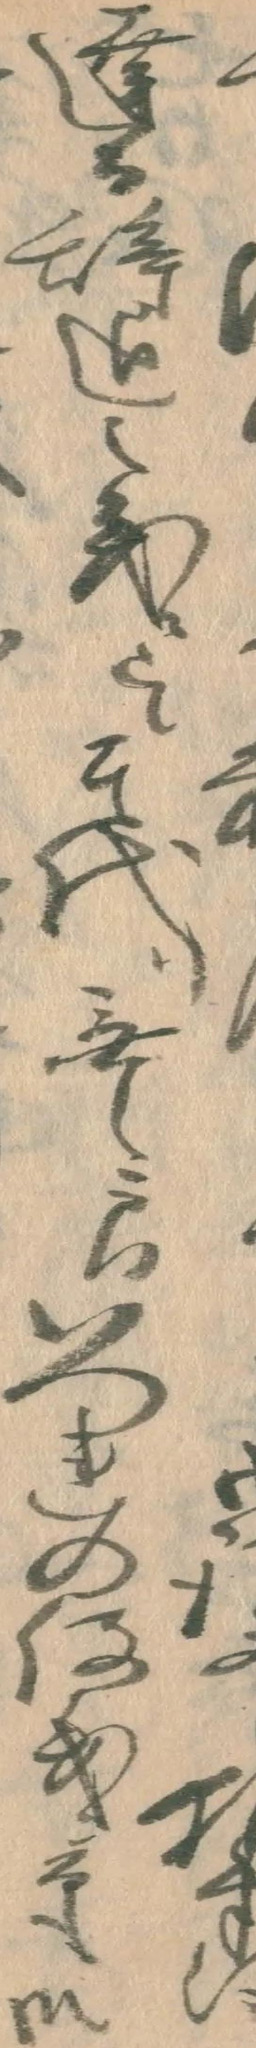達而辞退之義ニ候ハヽ其代り無之候間いつれの役義ニ而も御
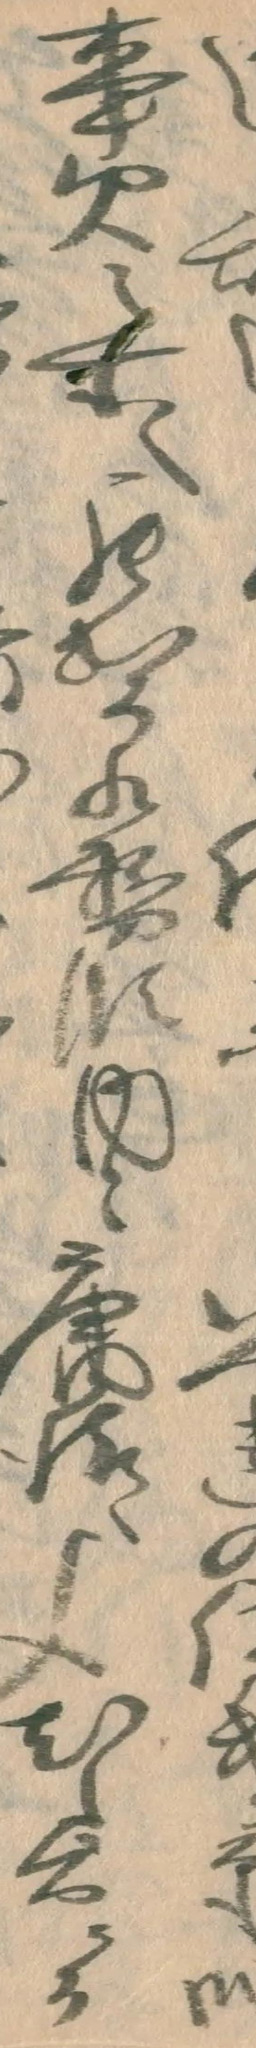事欠之所へ罷出可相務段内々庸清へ申入尤之旨ニ而
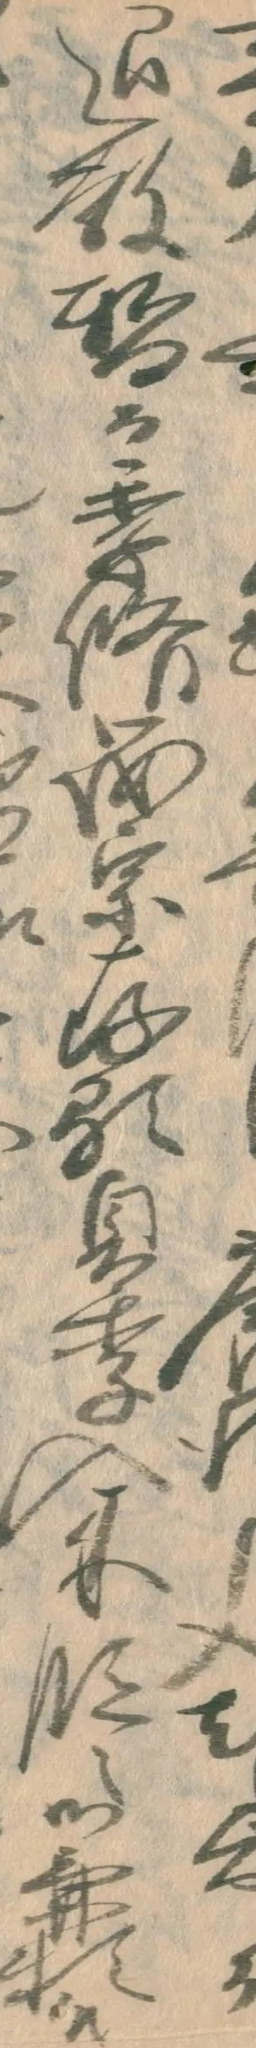退散暫而季脩茂宗存顕貞季入来段々兼頼共
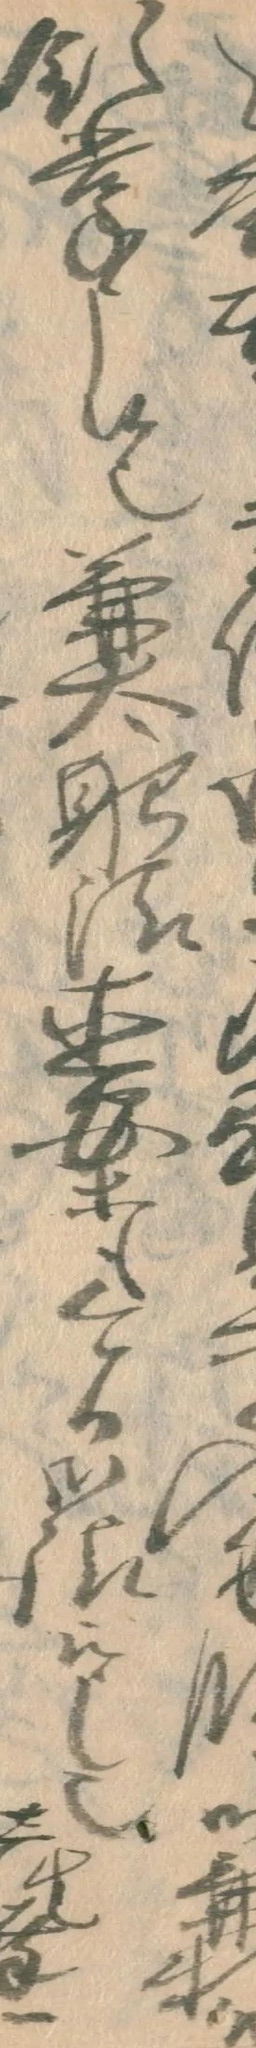領掌申候也兼太躬清直安等も今日御請被申候也産幸ハ
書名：賀茂社記録. 第60冊
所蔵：国立国会図書館 National Diet Library, JAPAN
